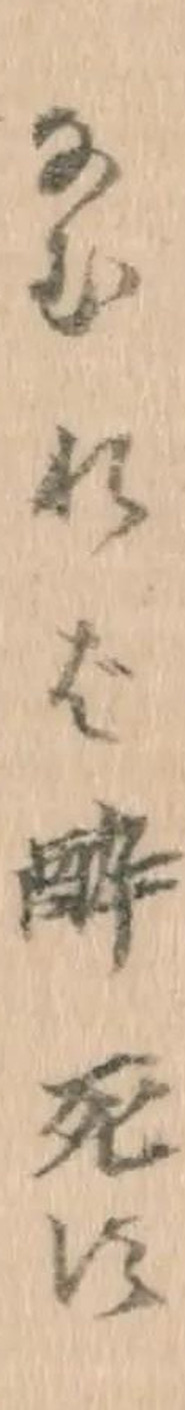なむれば酔死す
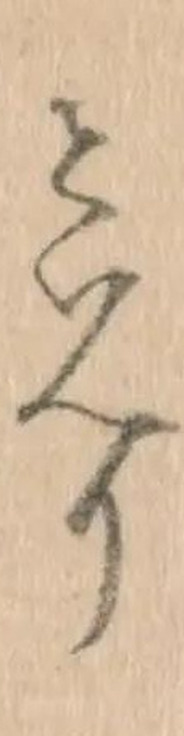といへり

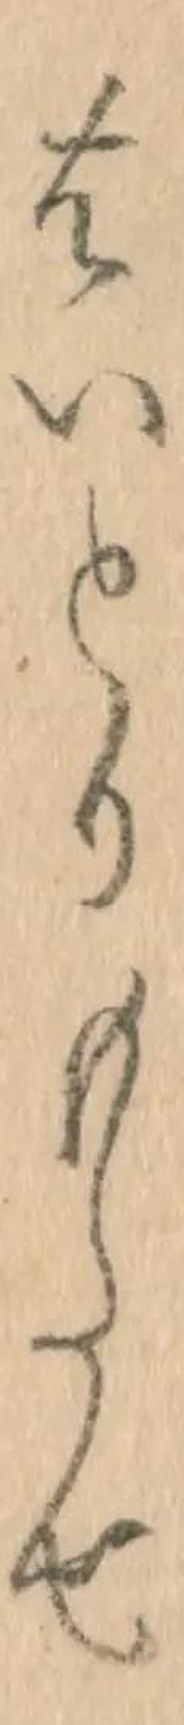はいとりもたせ
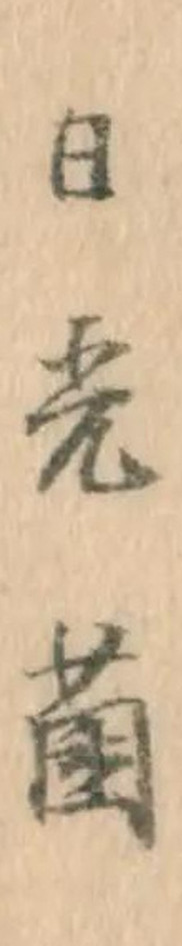日光菌
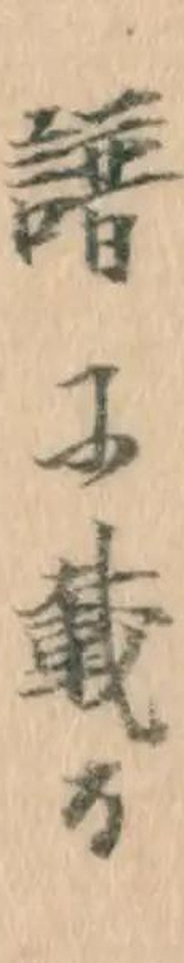譜に載る
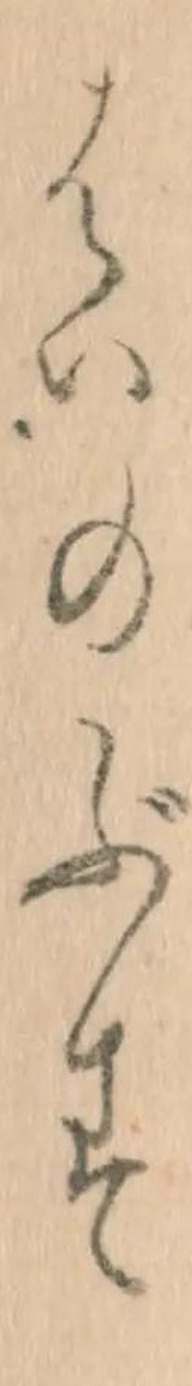はいのぶす
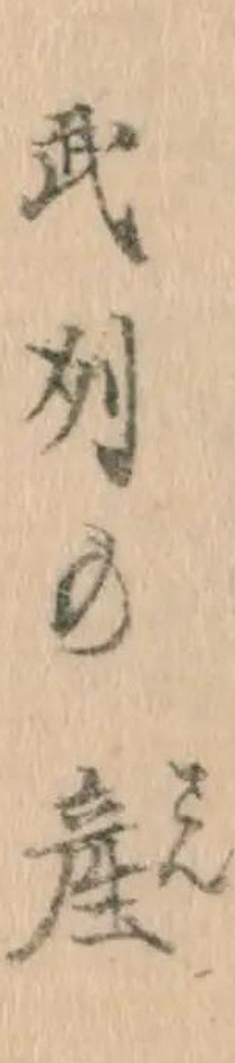武州の産
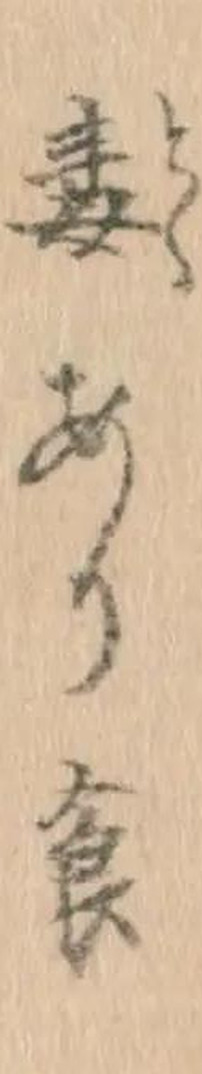毒あり食
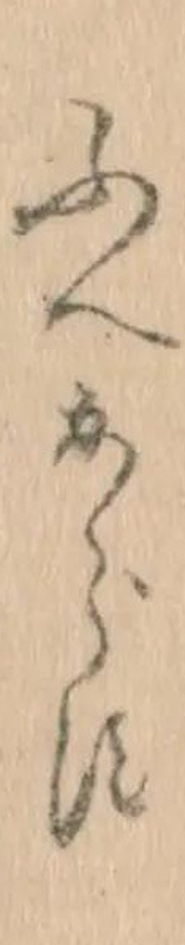ふへからす

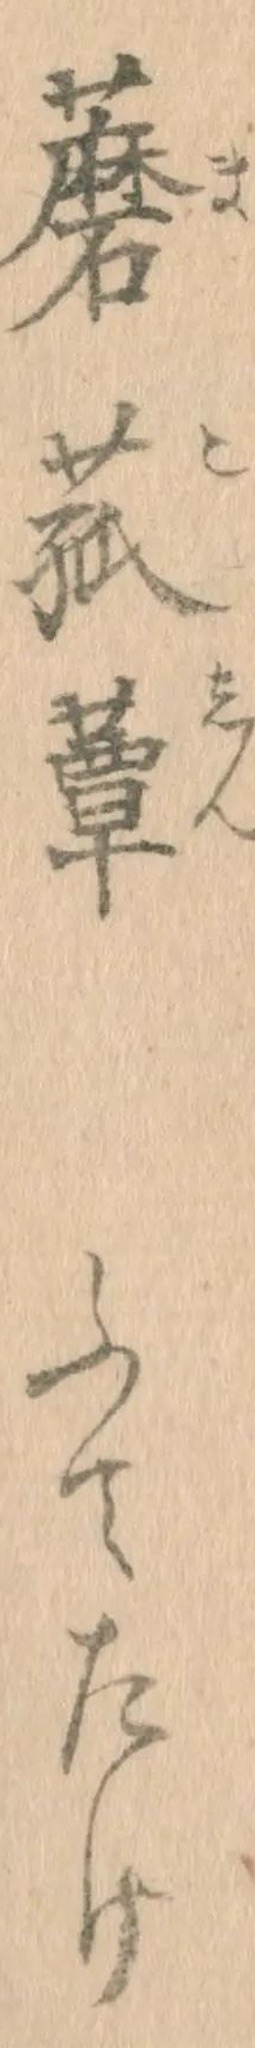蘑菰蕈ふてたけ
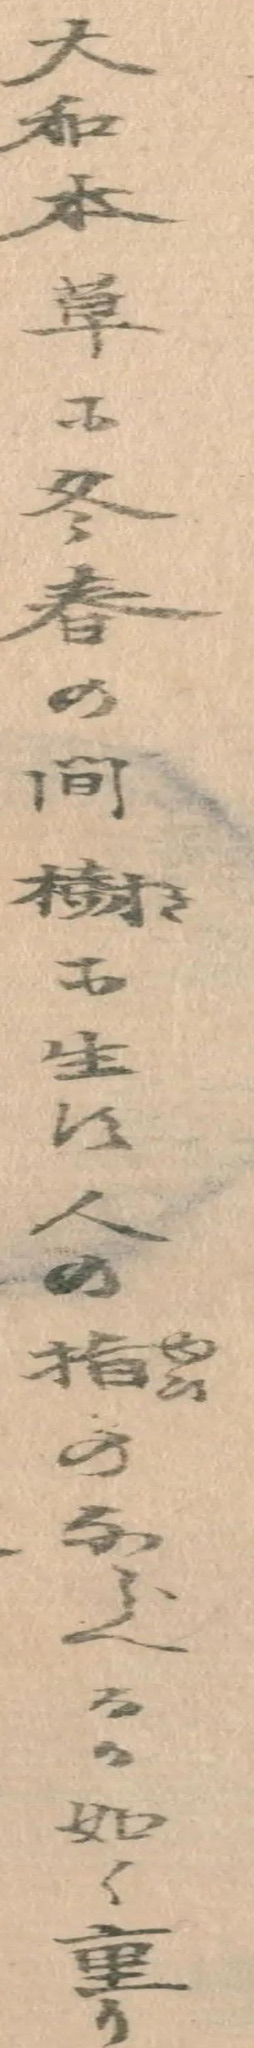大和本草に冬春の間樹に生す人の指のならへるか如く重り
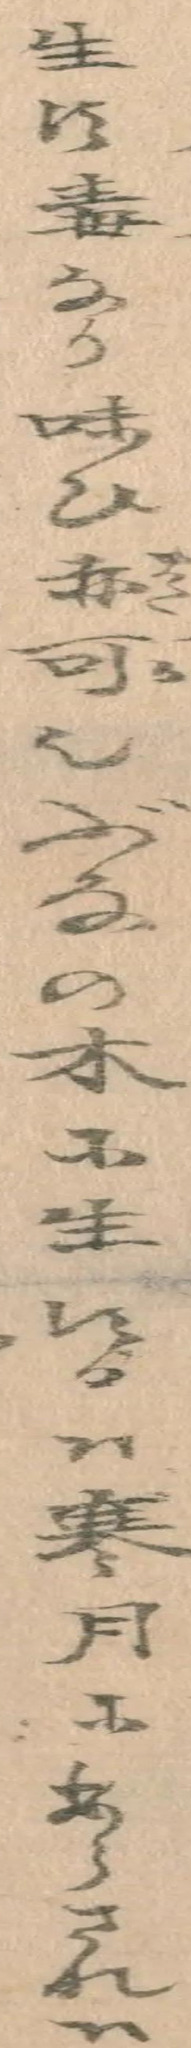生す毒なり味ひ赤可也ぶなの木に生するは寒月にあらされは
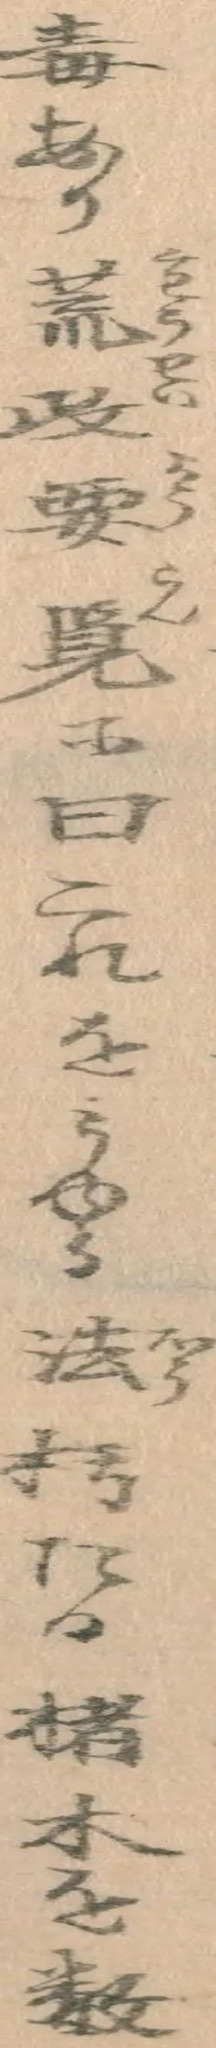毒あり荒政要覧に曰これをうゆる法朽たる楮木を数
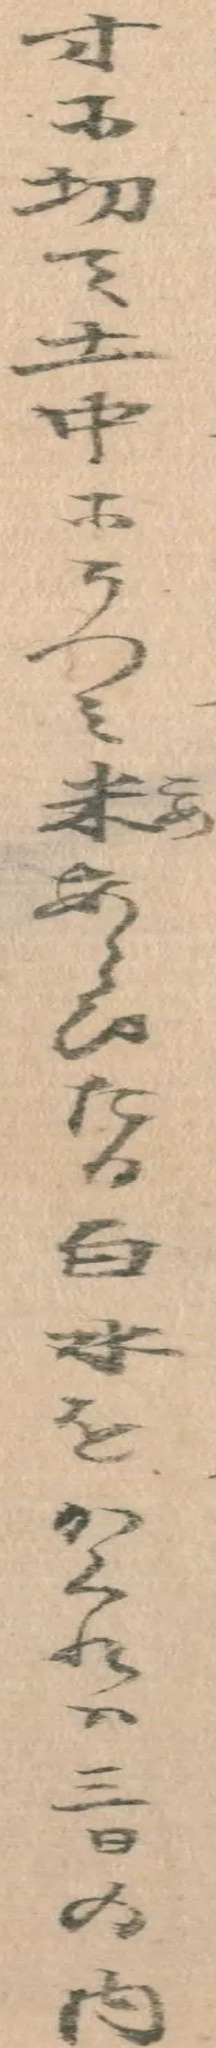寸に切て土中にうつみ米あらひたる白水をかくれは三日の内
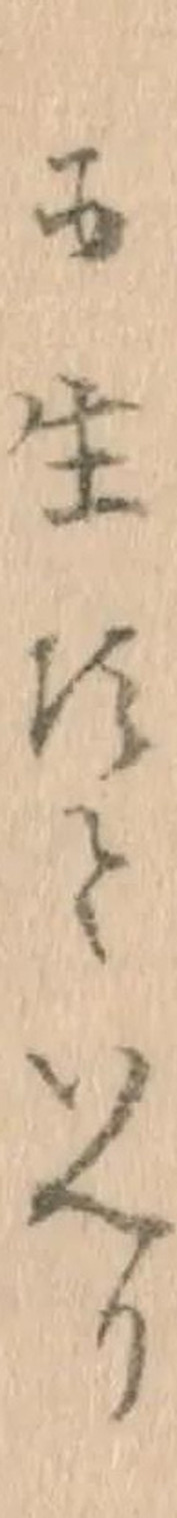に生すといへり
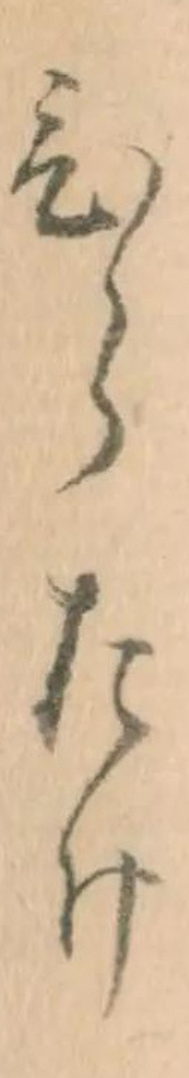ひらたけ
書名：本草図譜. 巻58-60
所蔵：国立国会図書館 National Diet Library, JAPAN
